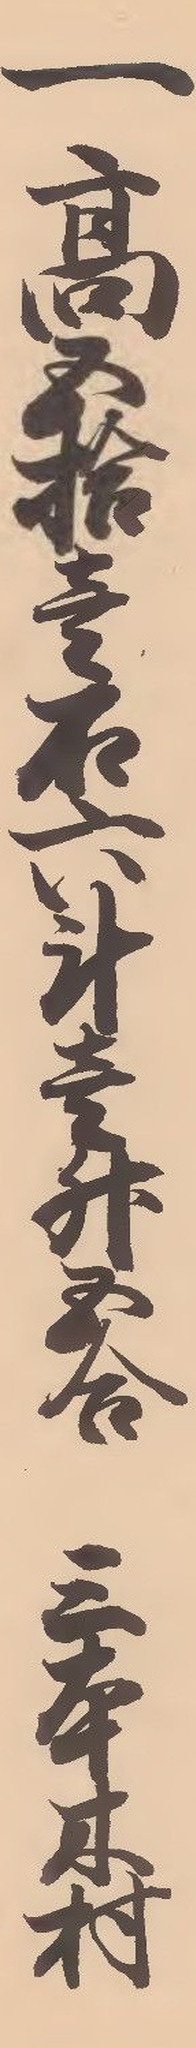一高五拾壱石六斗壱升五合三本木村

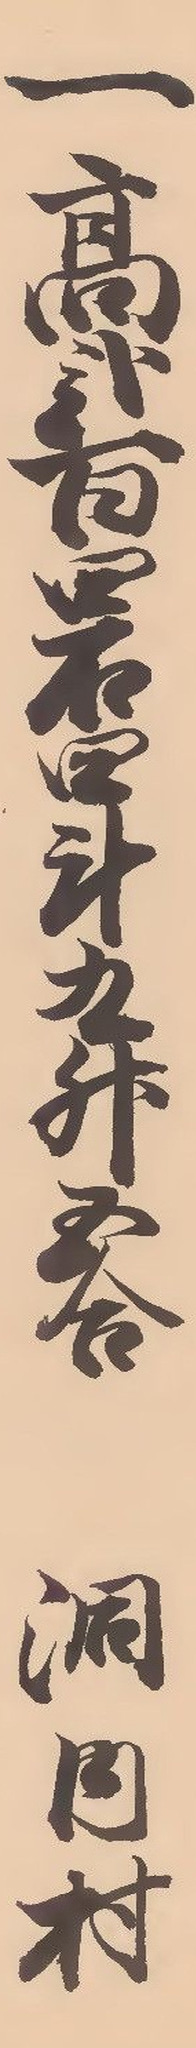一高弐百四石四斗九升五合洞内村
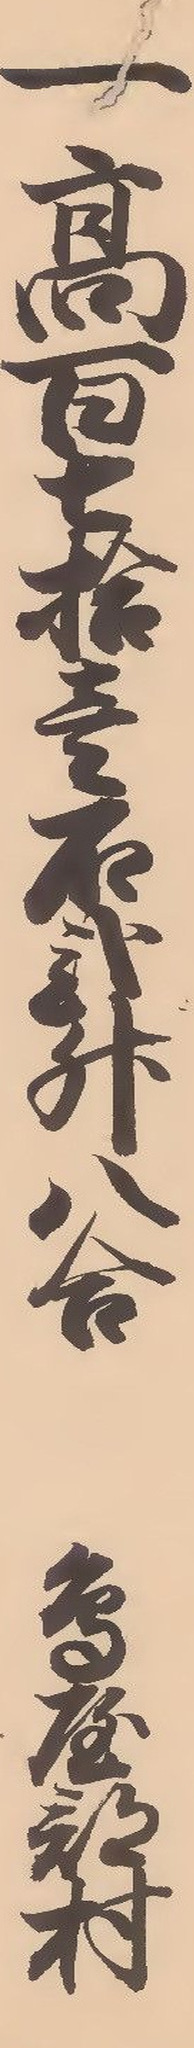一高百七拾壱石弐升八合鳥屋部村
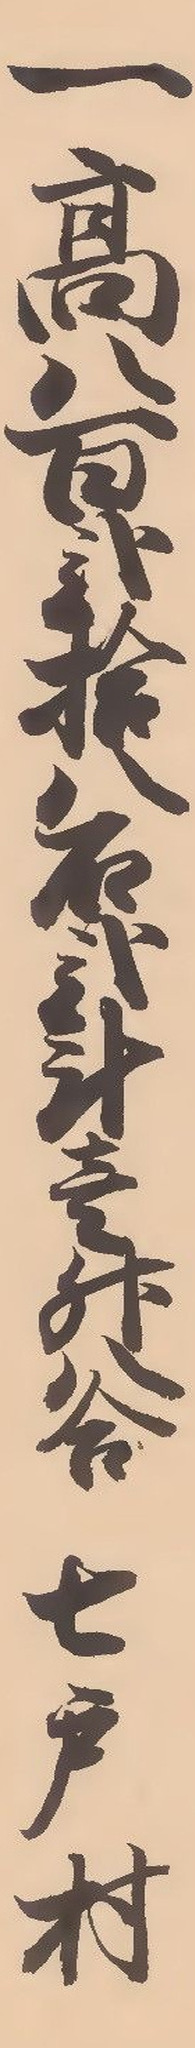一高八百弐拾八石弐斗壱升八合七戸村
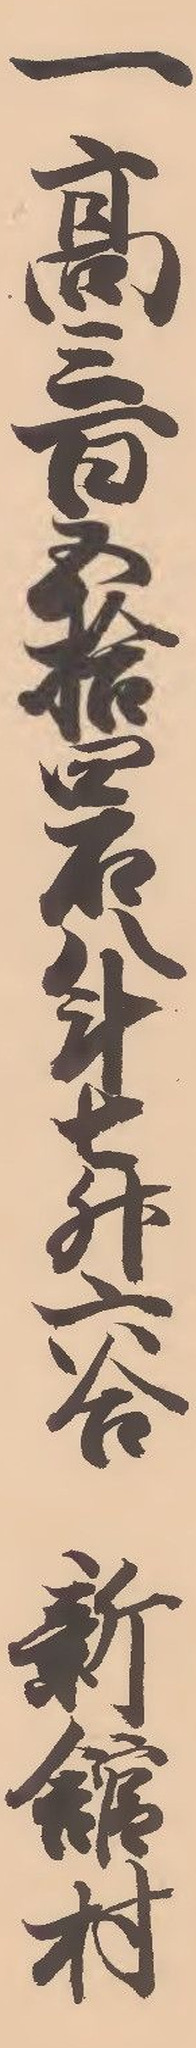一高三百五拾四石八斗七升六合新館村
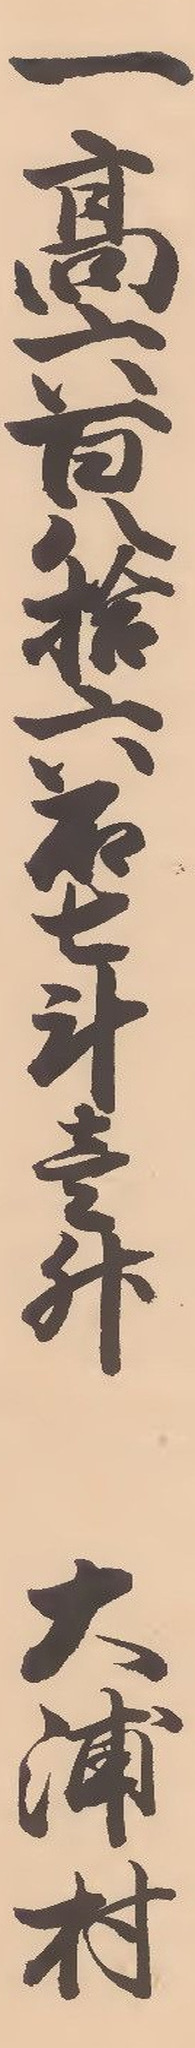一高六百八拾六石七斗壱升大浦村
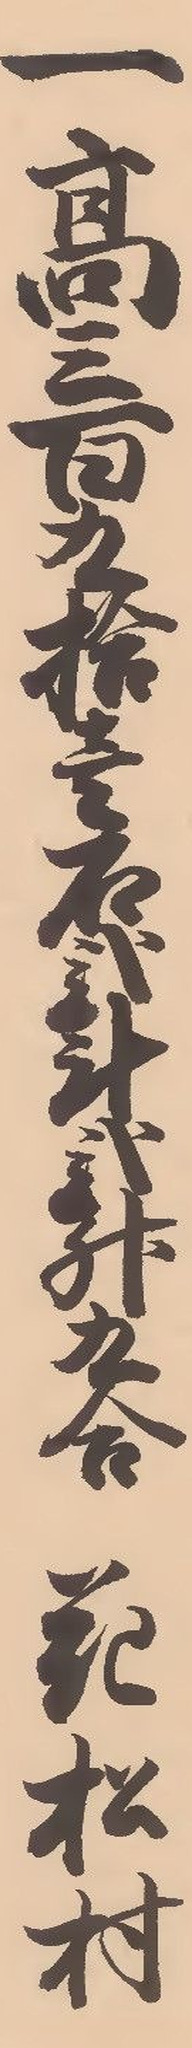一高三百九拾壱石弐斗弐升九合花松村
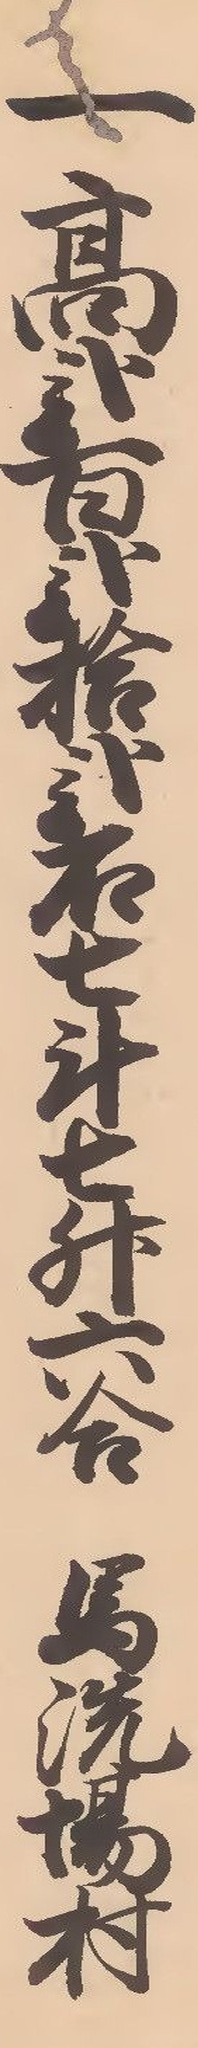一高弐百弐拾弐石七斗七升六合馬洗場村
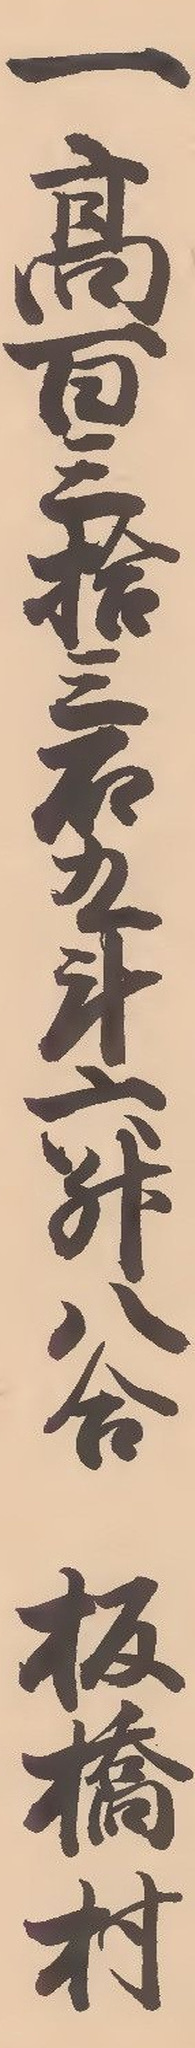一高百三拾三石九斗六升八合板橋村

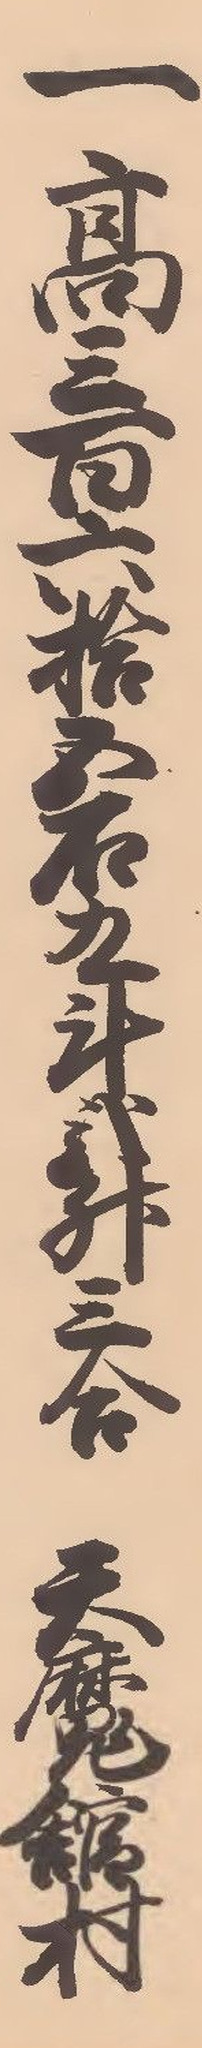一高三百六拾五石九斗弐升三合天魔館村
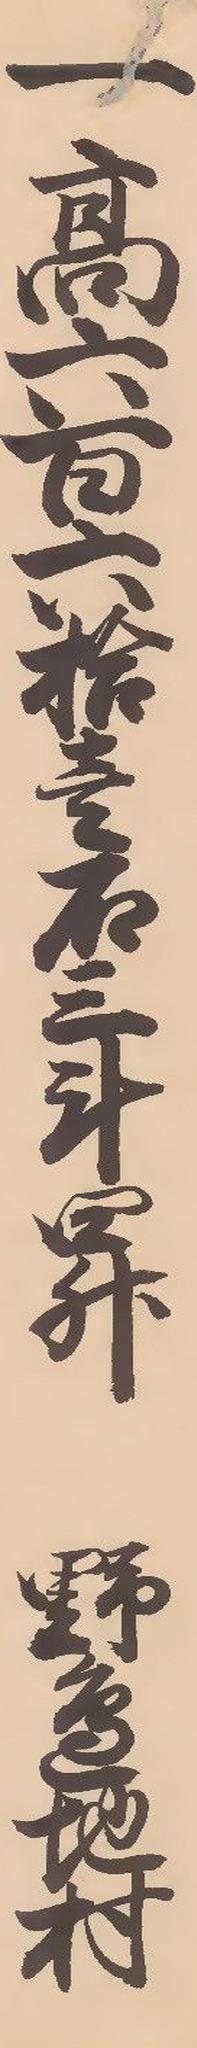一高六百六拾壱石三斗四升野辺地村
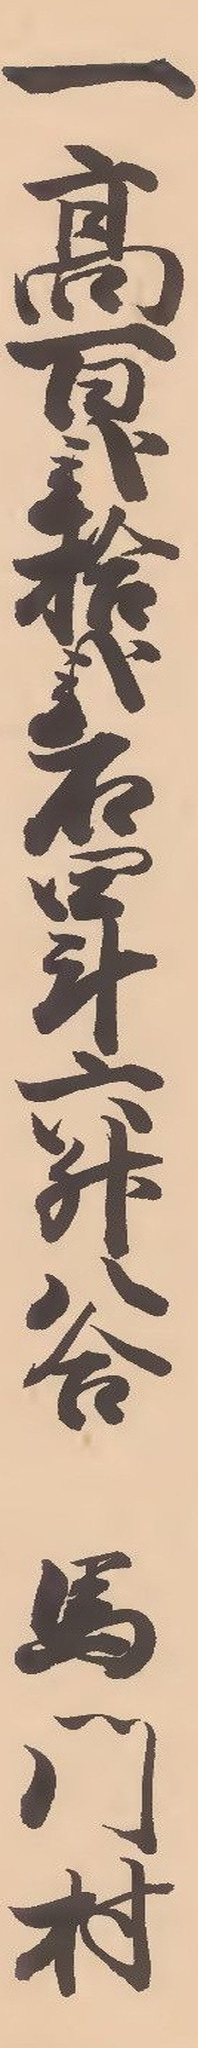一高百弐拾弐石四斗六升八合馬門村
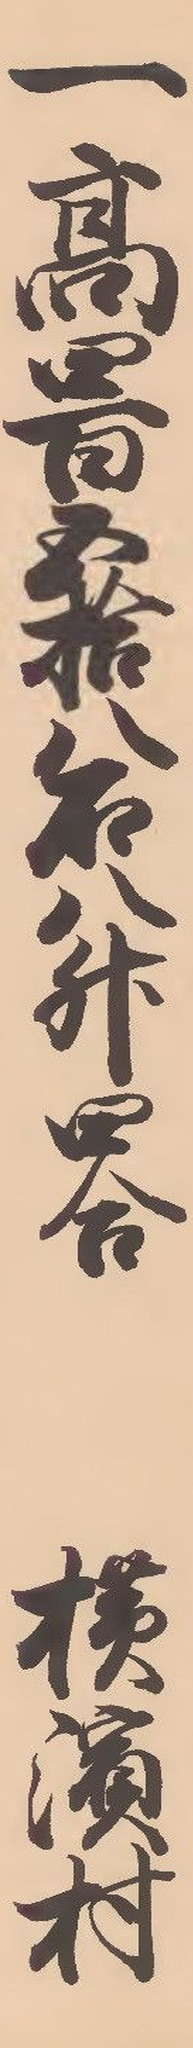一高四百五拾八石八升四合横浜村
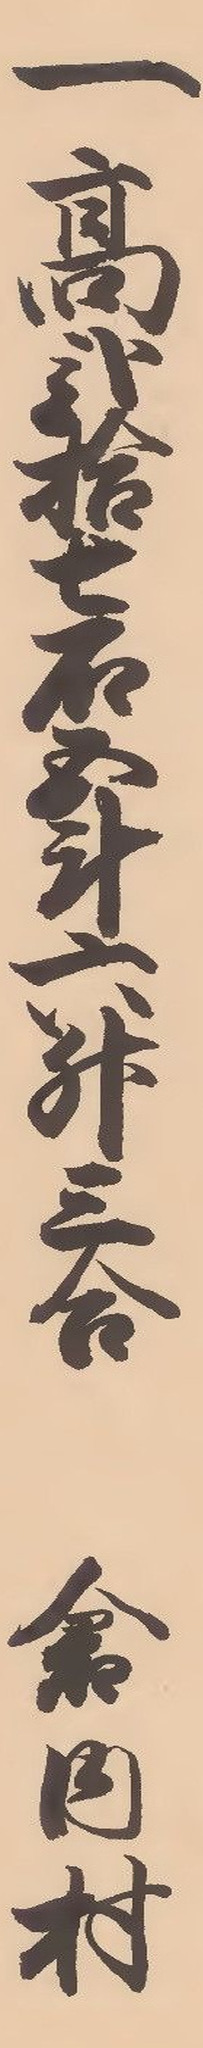一高弐拾七石五斗六升三合倉内村
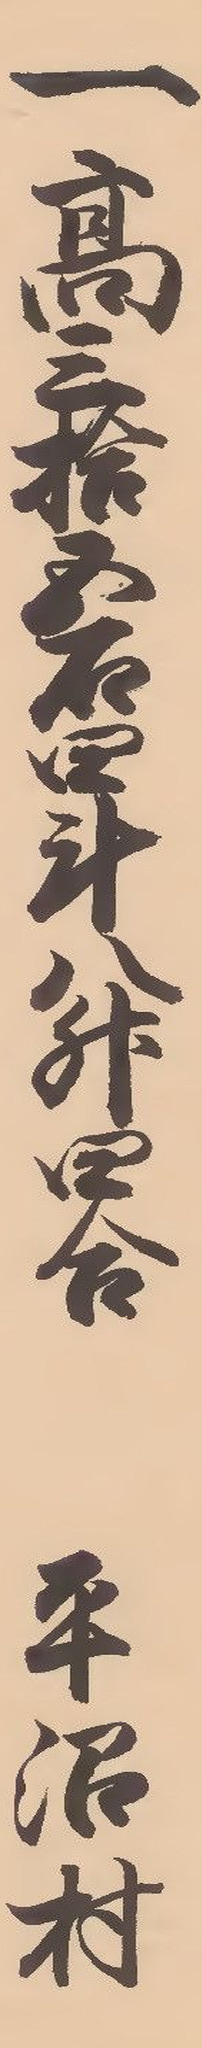一高三拾五石四斗八升四合平沼村
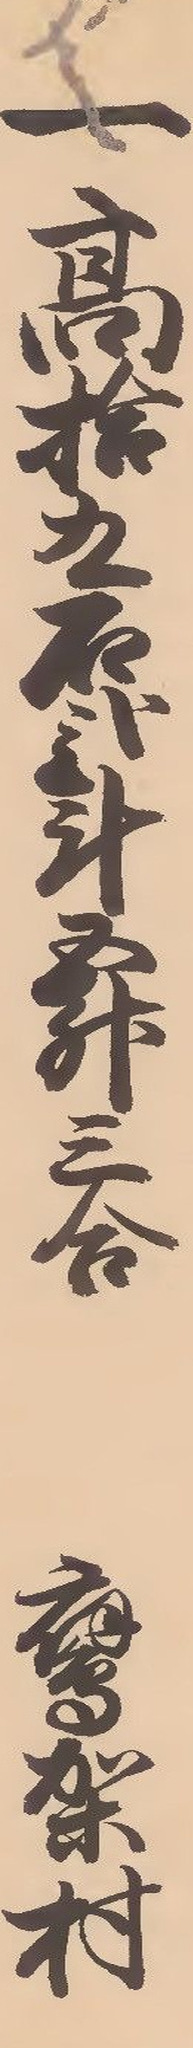一高拾九石弐斗五升三合鷹架村
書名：陸奥国郷帳　６
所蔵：国立公文書館 National Archives of Japan
